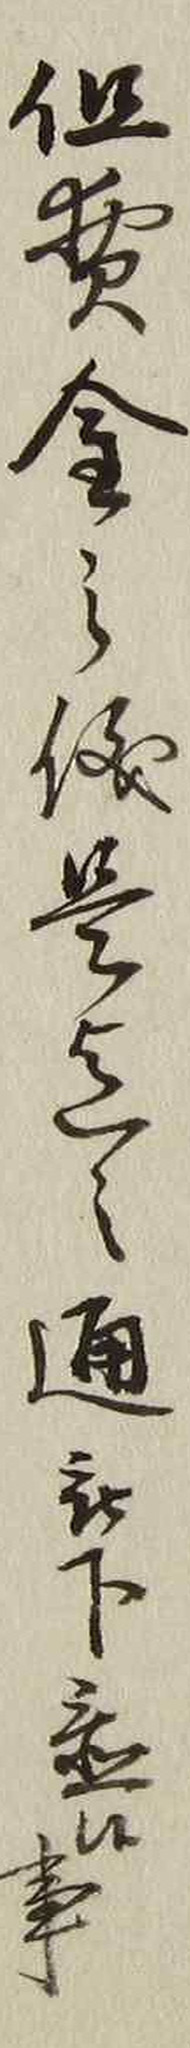但費金之儀是迄之通被下置候事
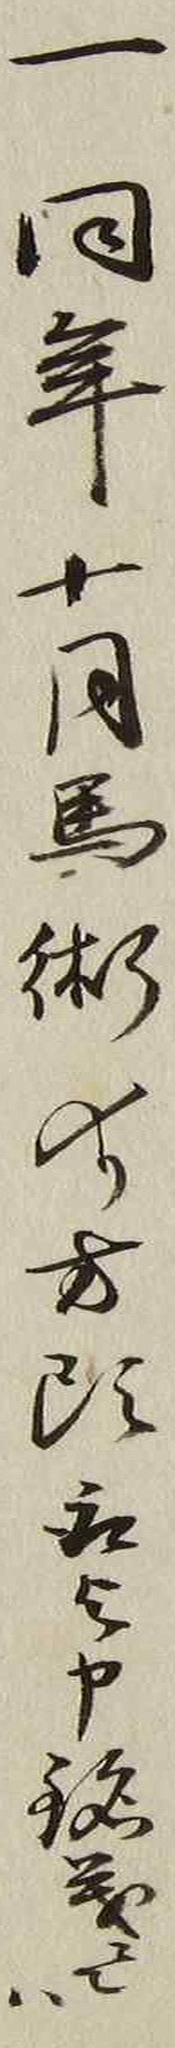一同年十月馬術〆り方頭取と申銘義ニてハ
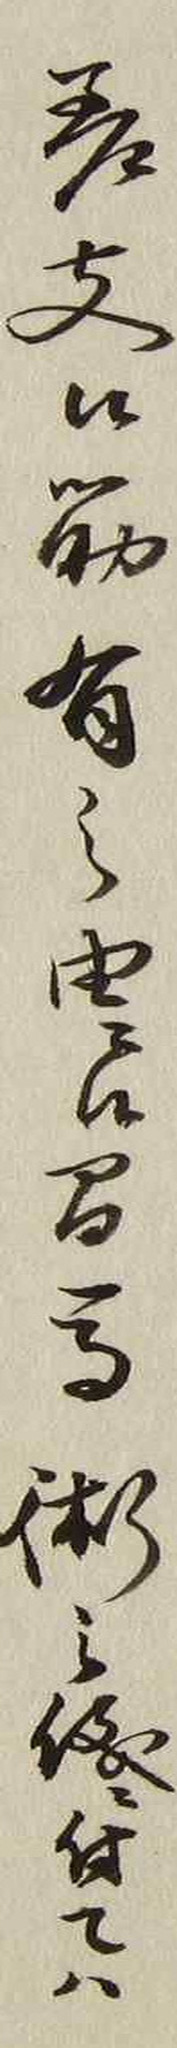差支候筋有之由ニ候間馬術之儀ニ付てハ
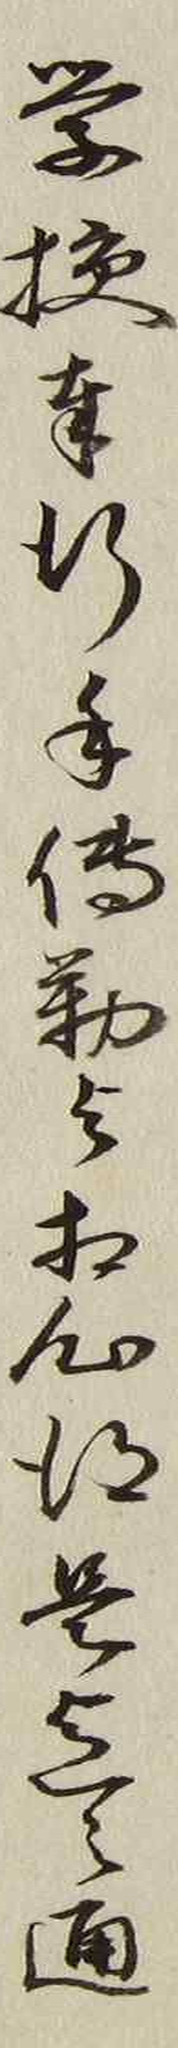学校奉行手伝勤と相心得是迄之通
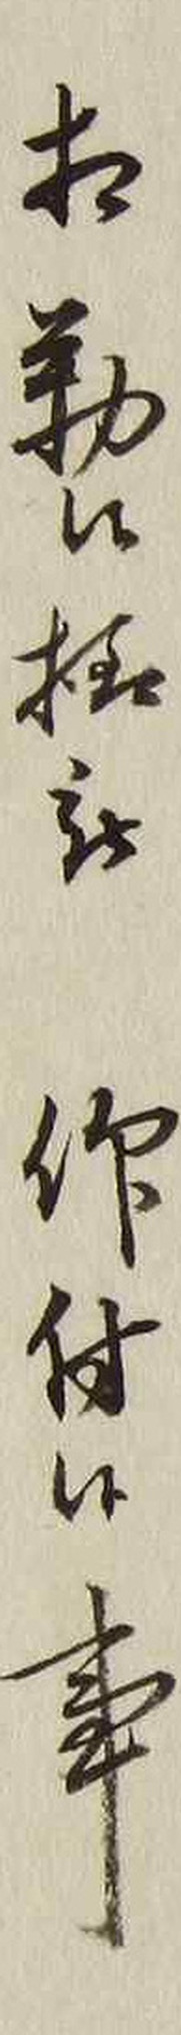相勤候様被仰付候事
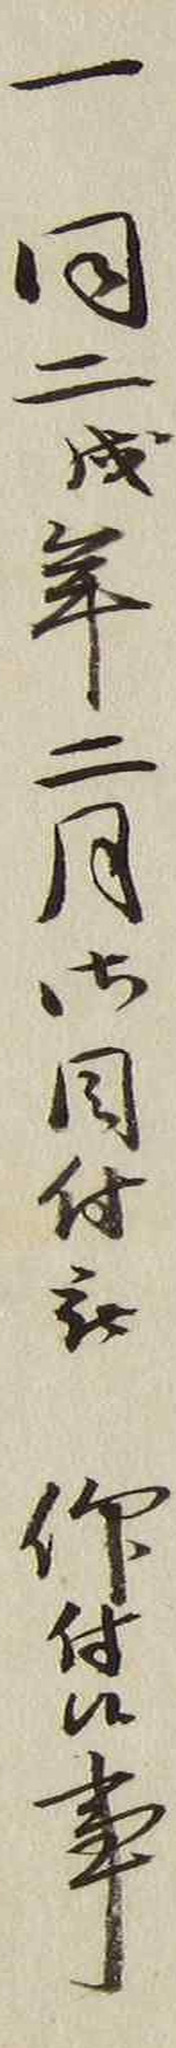一同二戌年二月御目付被仰付候事

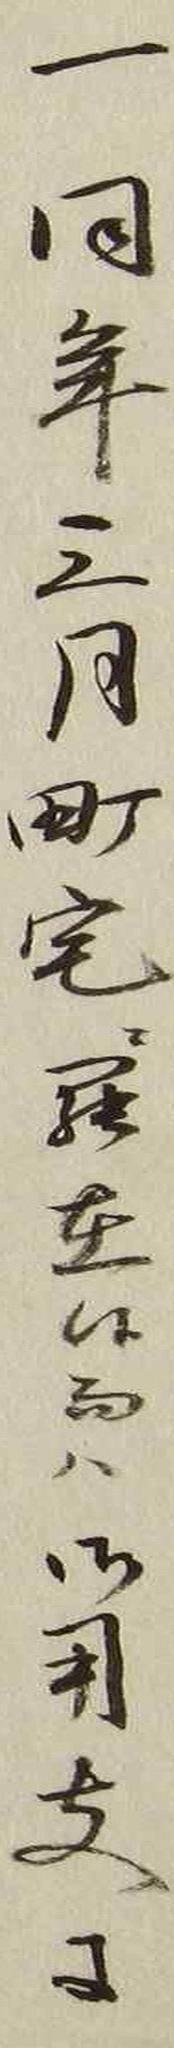一同年三月町宅ニ罷在候而ハ御用支に
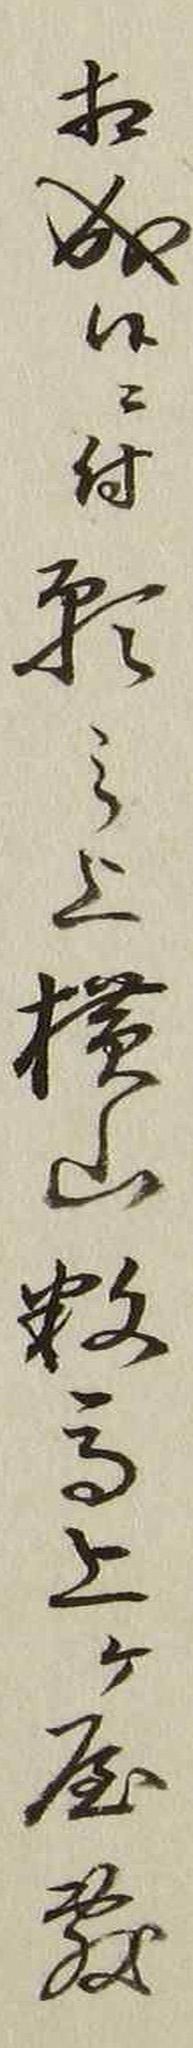相成候ニ付願之上横山数馬上ケ屋敷
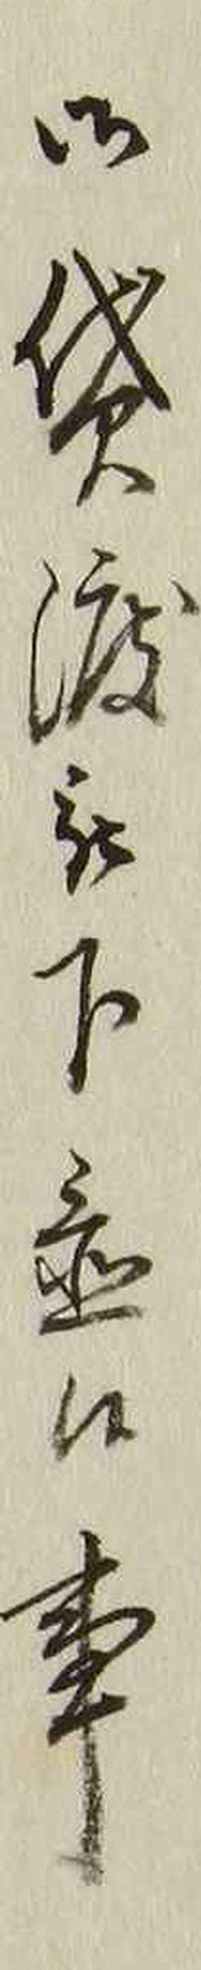御貸渡被下置候事
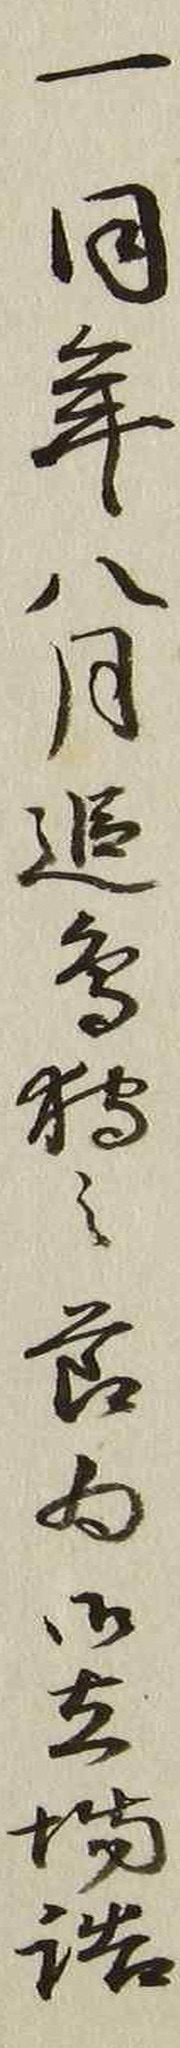一同年八月追鳥狩之節為御立場詰
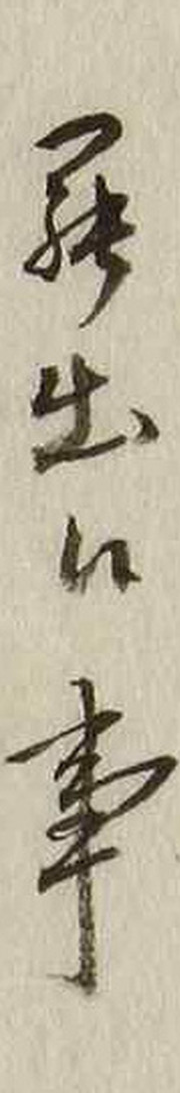罷出候事
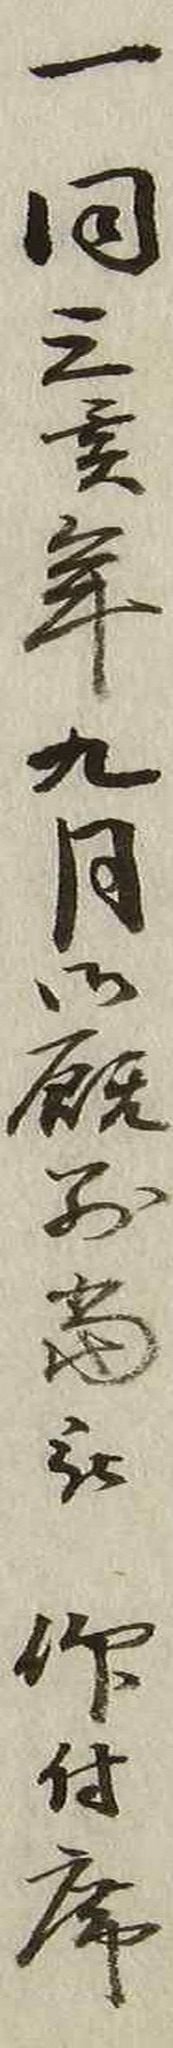一同三亥年九月御厩別當被仰付席
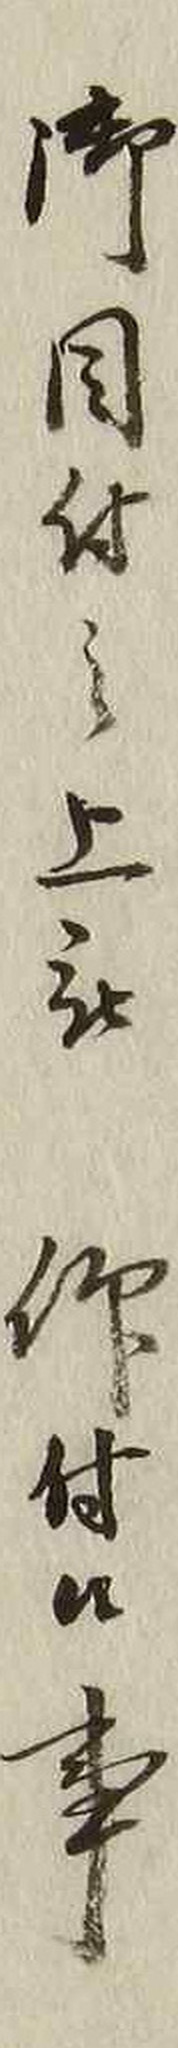御目付之上被仰付候事
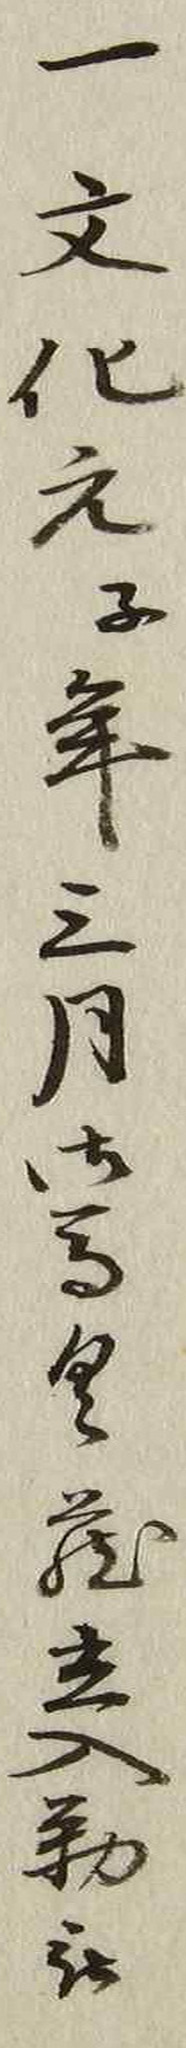一文化元子年三月御馬具蔵立入勤被
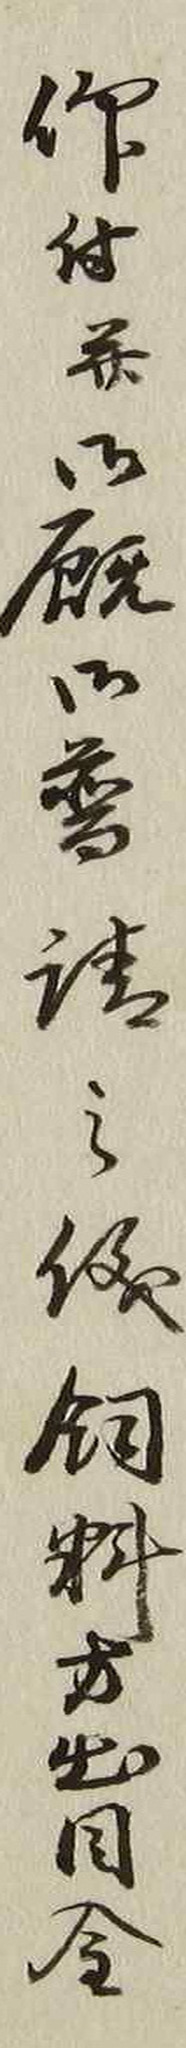仰付并御厩御普請之儀飼料方出目金
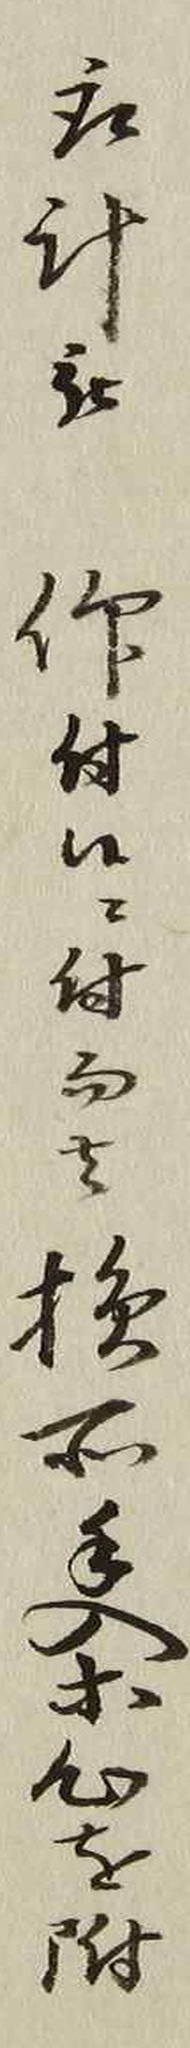取計被仰付候ニ付而は損所手入等心を附
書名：諸士系譜　巻之160　な之部2
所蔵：会津若松市立会津図書館
